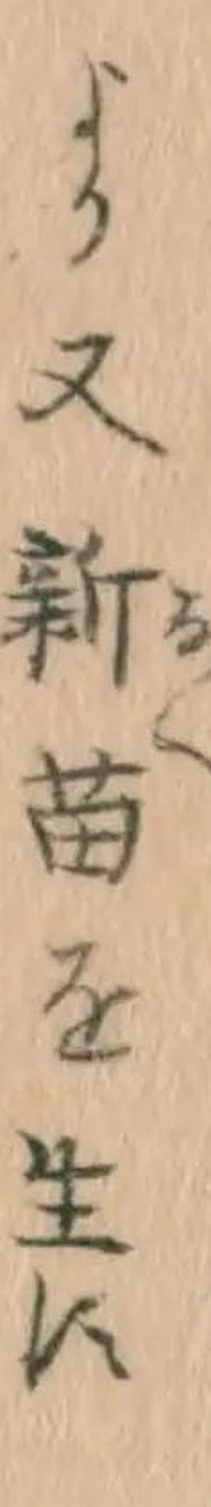より又新苗を生す
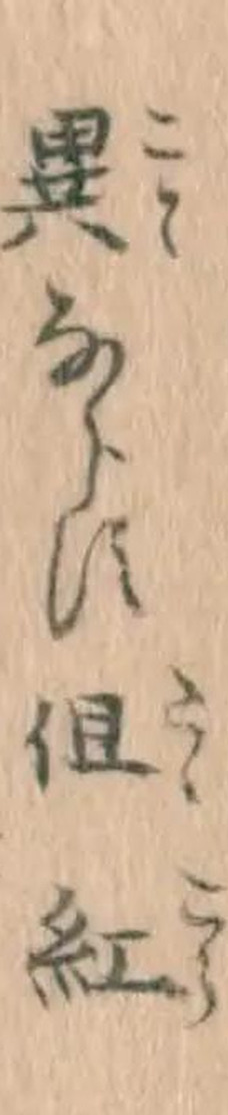異ならす但紅
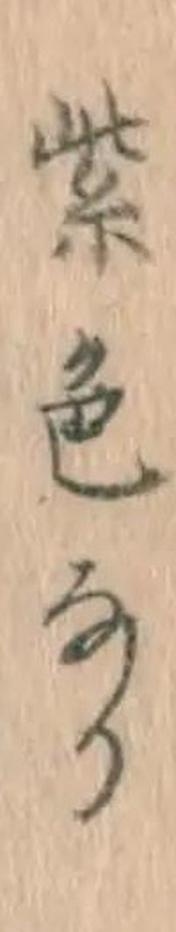紫色なり

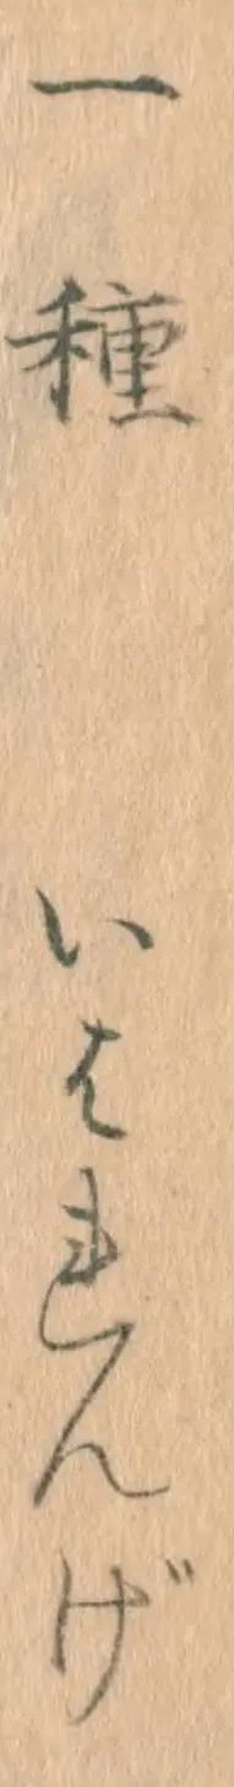一種いはれんげ
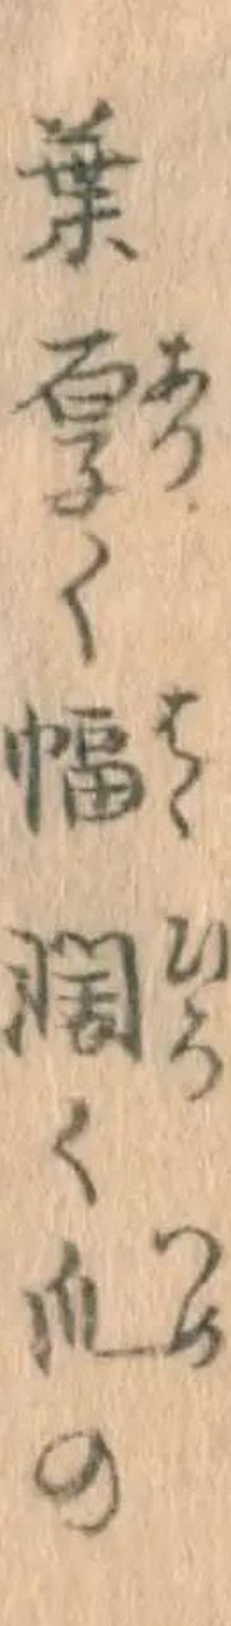葉厚く幅闊く爪の
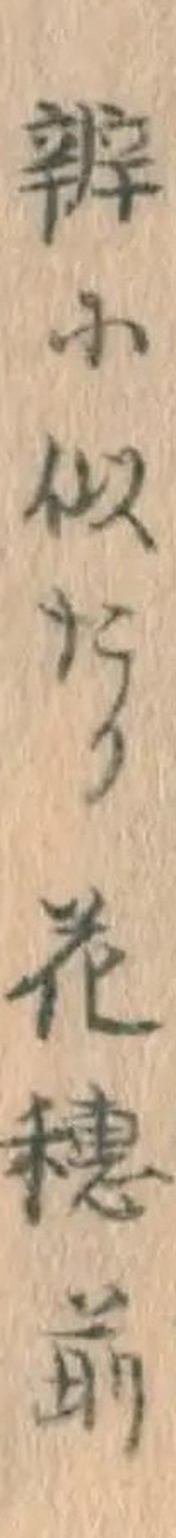弁に似たり花穂前
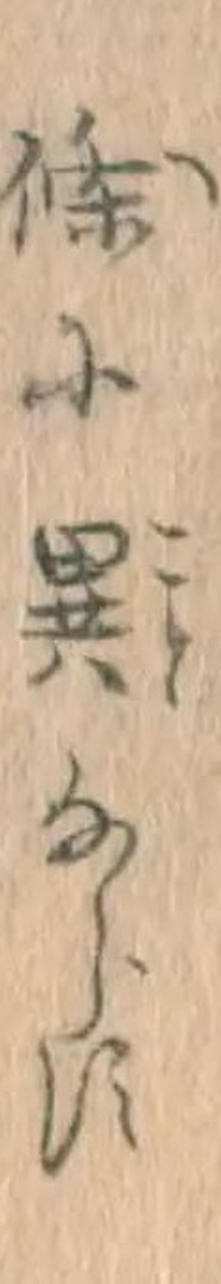条に異ならす
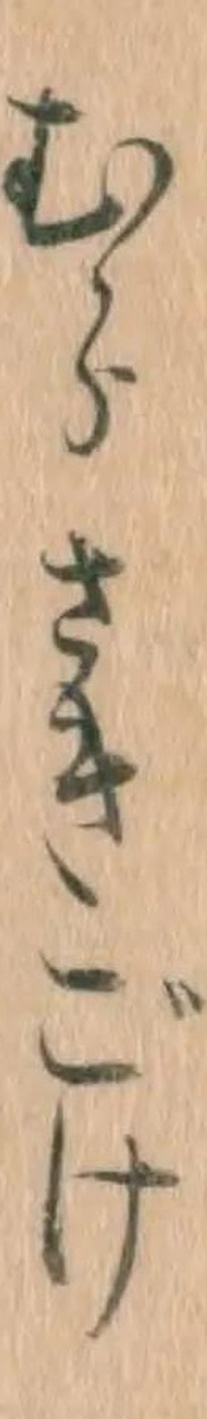むらさきごけ
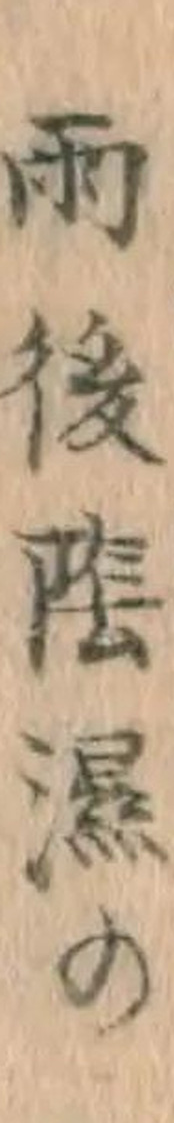雨後陰湿の
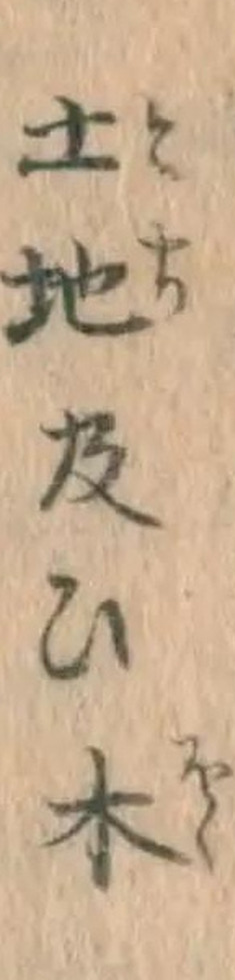土地及ひ木
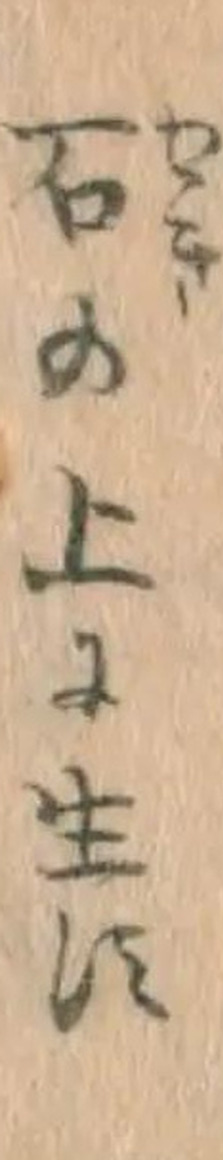石の上に生す

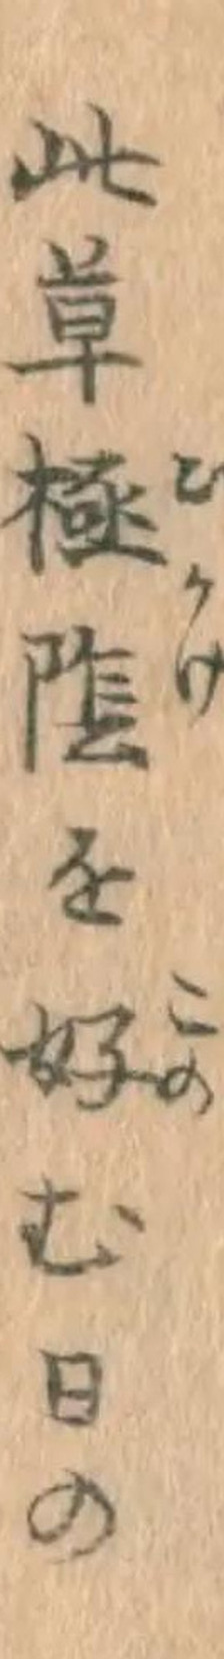此草極陰を好む日の
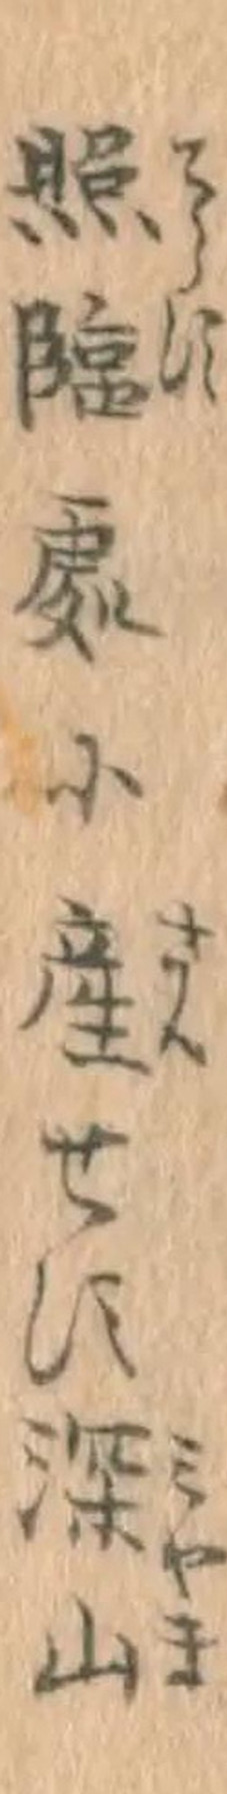照臨処に産せす深山
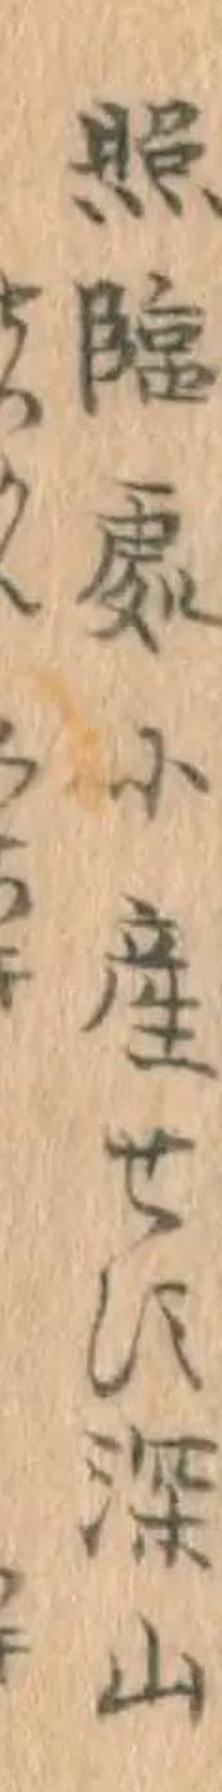照臨処に産せす深山
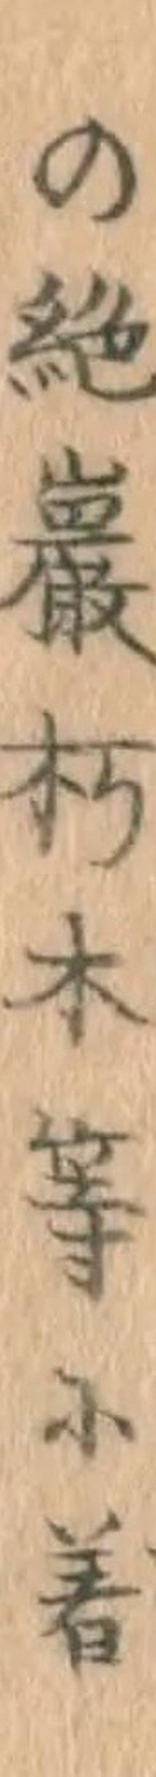の絶巌朽木等に着
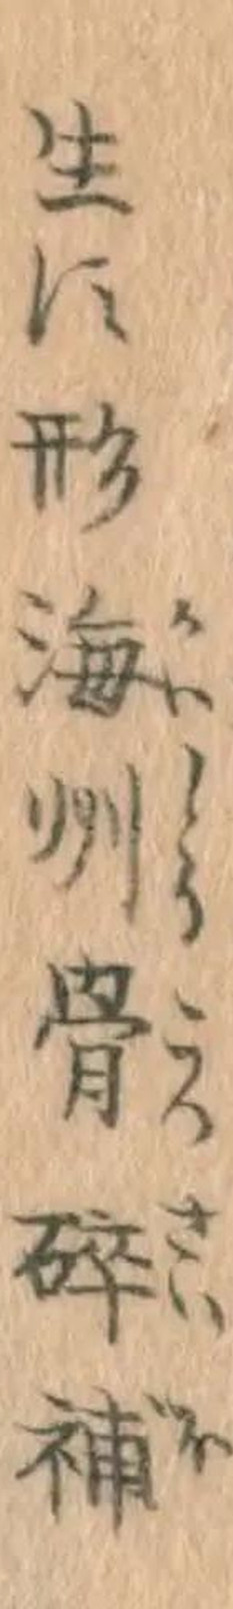生す形海州骨砕補
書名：本草図譜. 巻37-39
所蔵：国立国会図書館 National Diet Library, JAPAN
